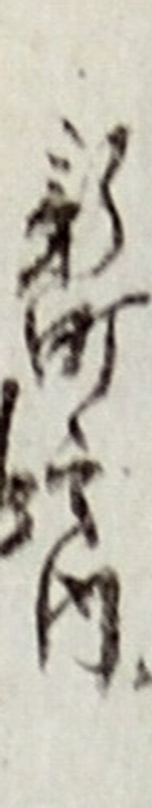新町之内

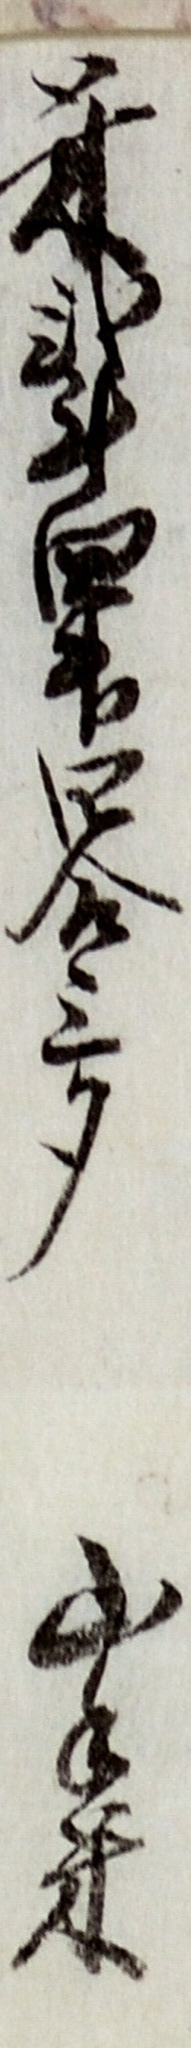米弐斗四升四合三勺山手米
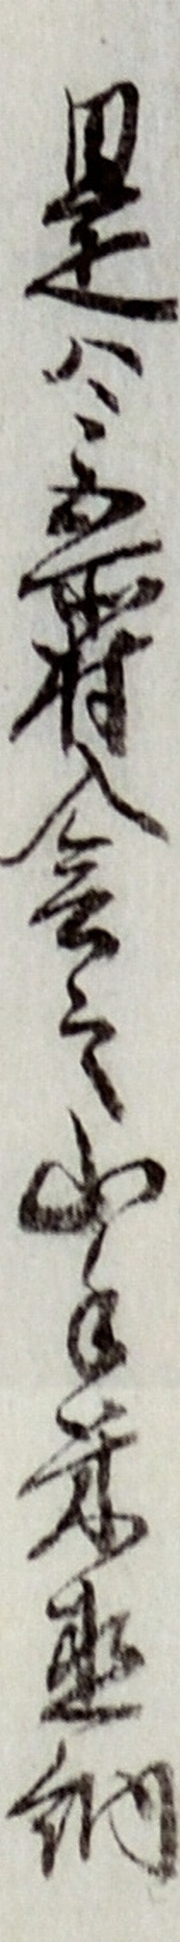是ハ宮所村入会之山手米直納

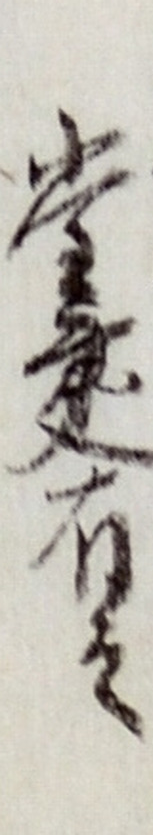堂建有之
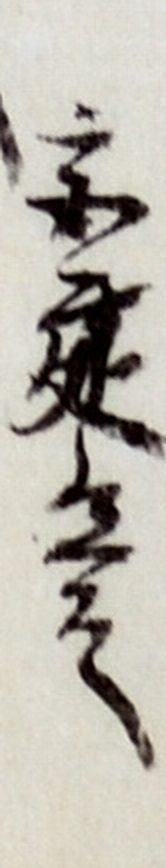宮建有之
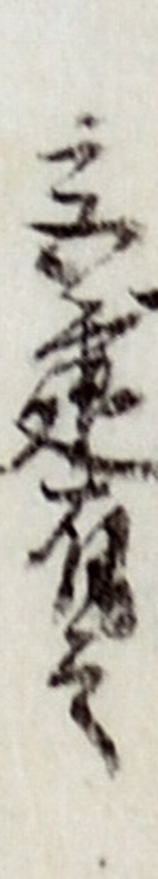宮建有之
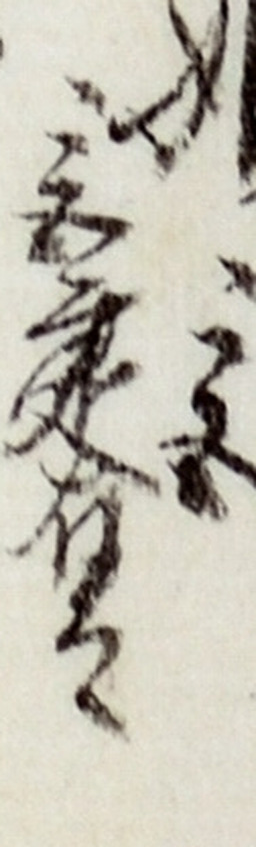宮建有之
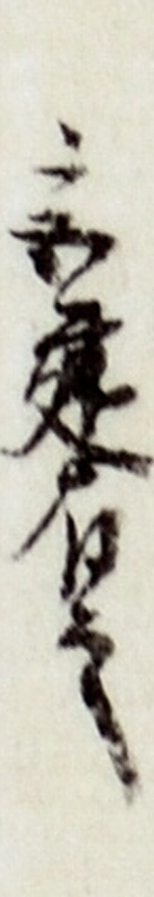宮建有之
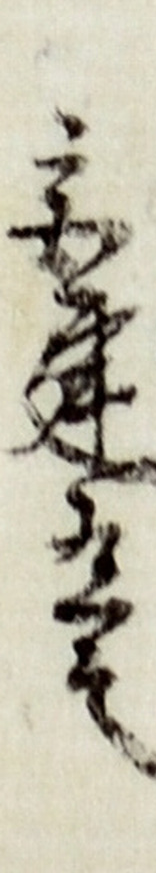宮建有之
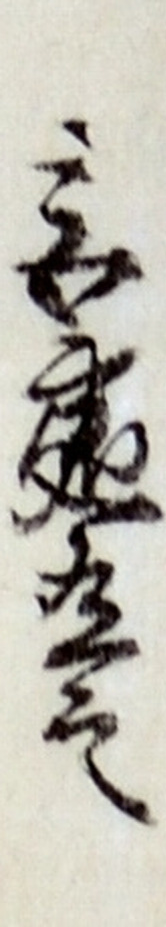宮建有之
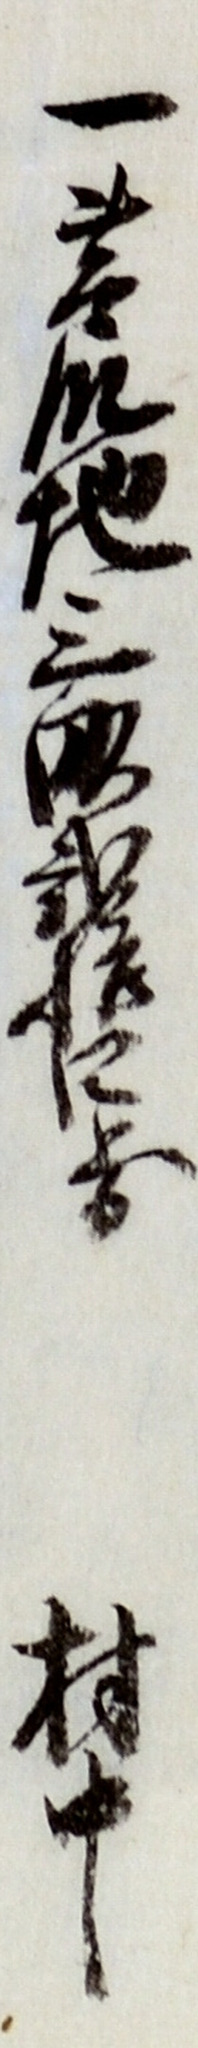一荒地三畝弐拾四歩村中
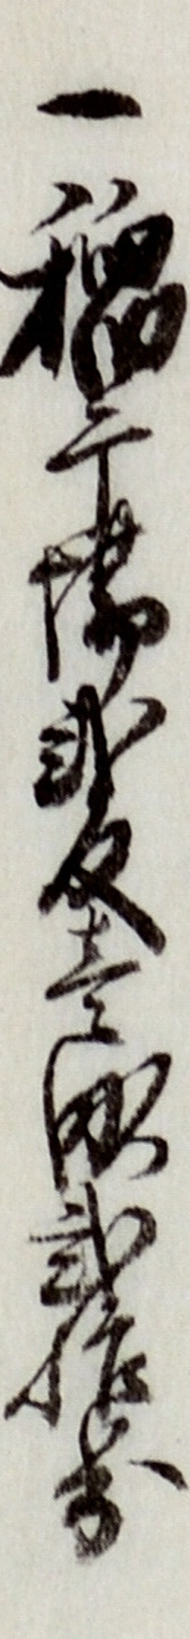一稲干場弐反壱畝弐拾歩

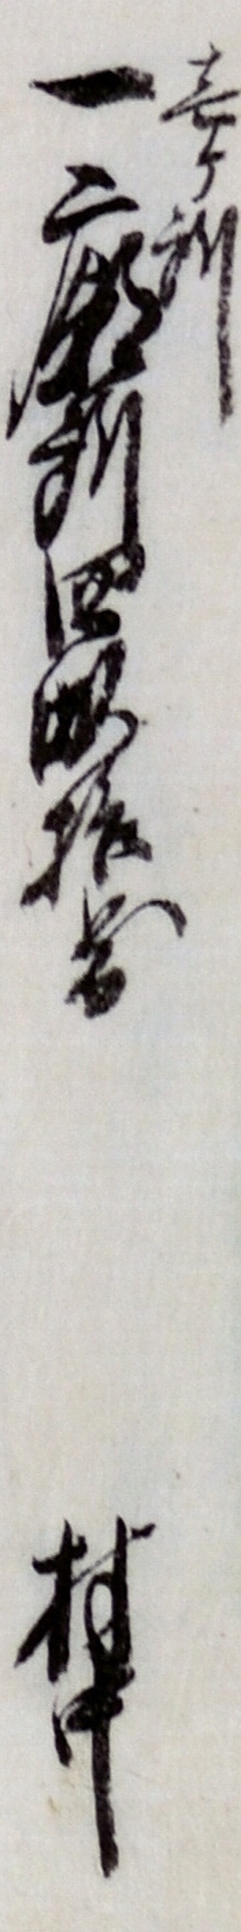一廟所四畝拾歩村中
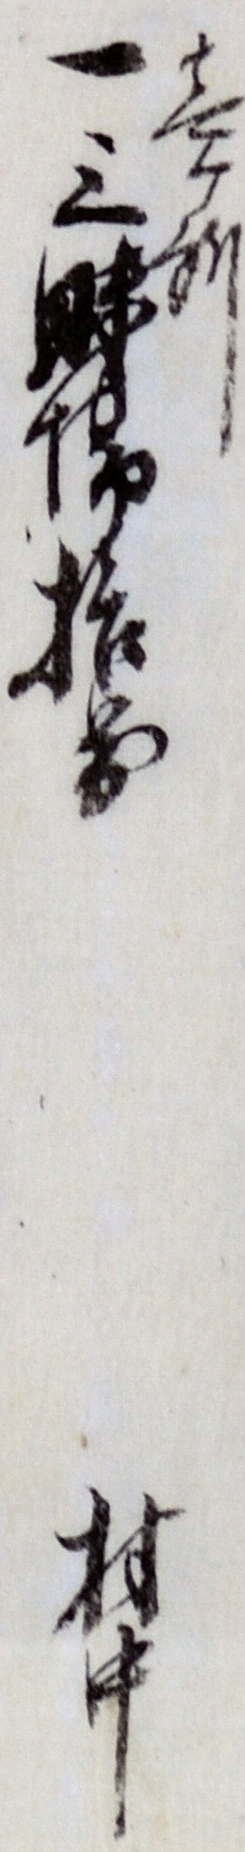一三昧場拾歩村中
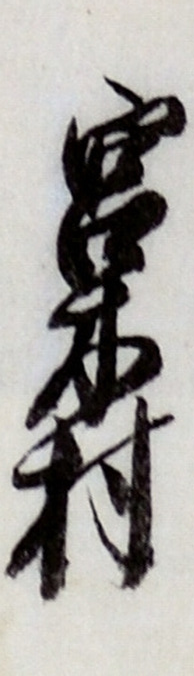宮木村
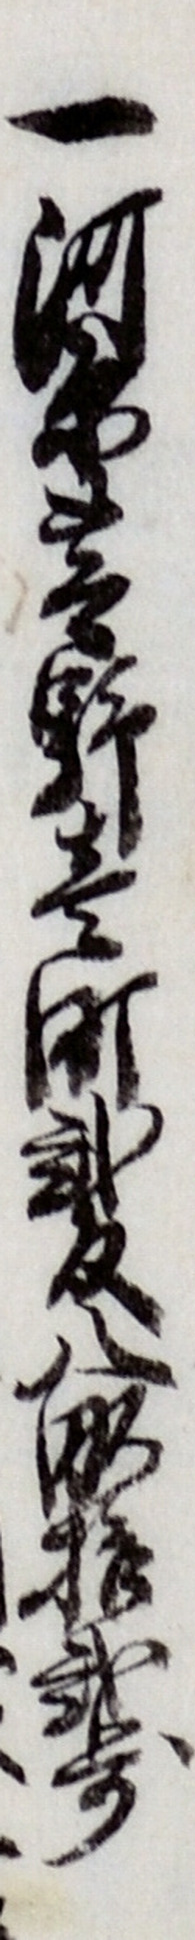一河原芝野壱町弐反八畝拾弐歩
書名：御領分中山林社地手控
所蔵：伊那市立高遠町図書館・合同会社AMANE
